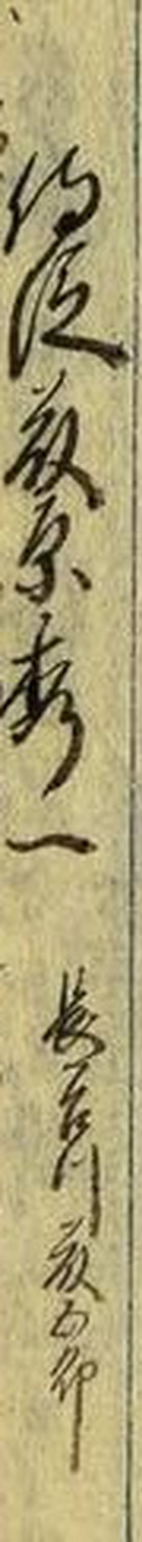侍従藤原秀一長谷川藤五郎
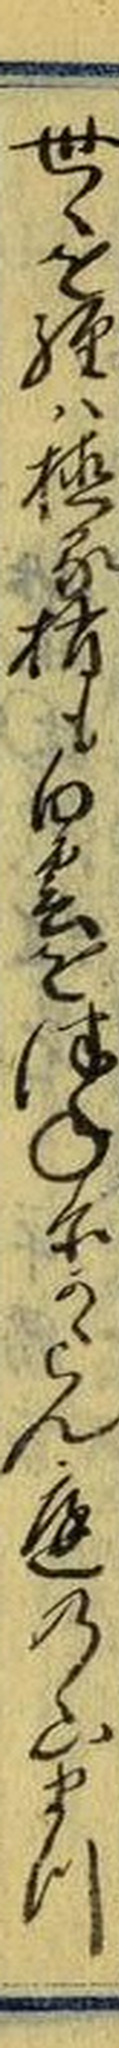世々を經は植る梢も白雲をつねにかゝらん庭の山まつ
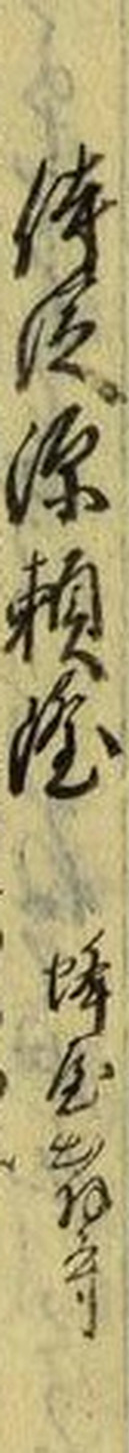侍従源頼隆蜂屋出羽守
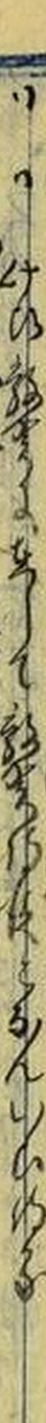同同此頃敦賀に在して敦賀侍従となんいひける
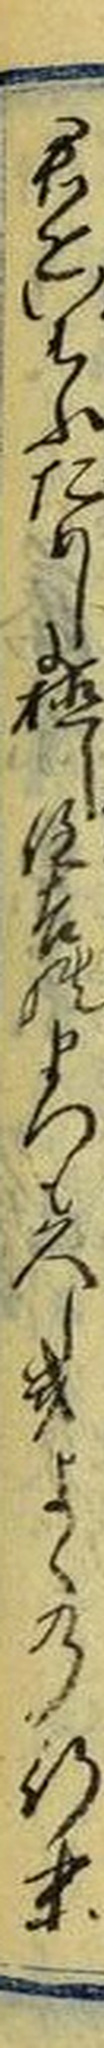君をいはふためしに植し住吉のまつも久しきよゝの行末
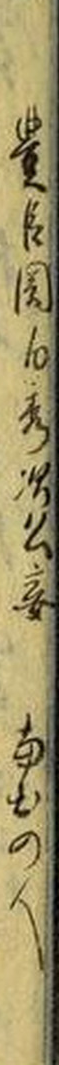少将豊臣関白秀次公妾當国の人
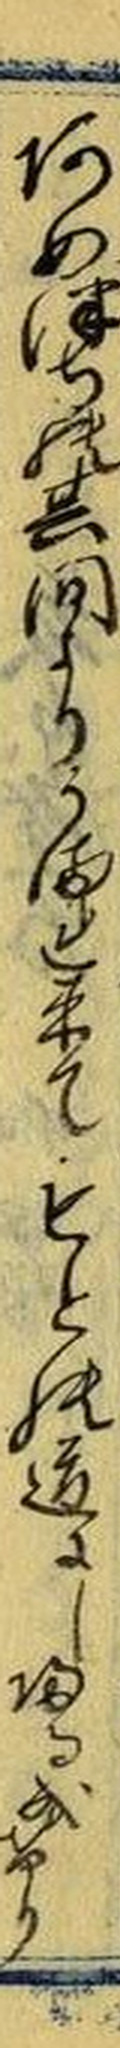あめつちの其間よりうまれ来てもとの道にし帰る成けり
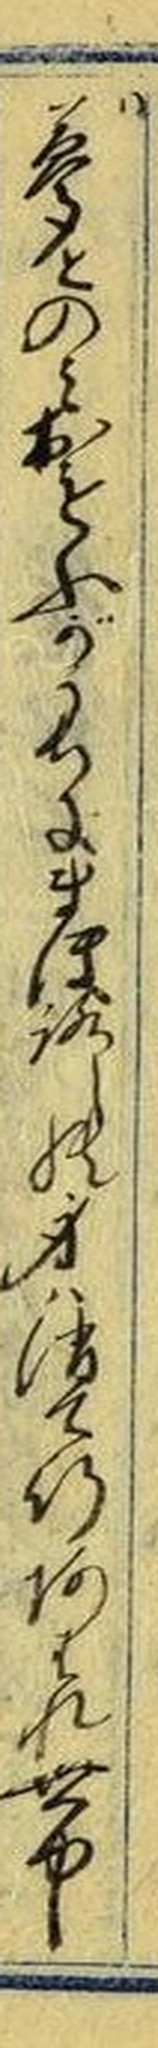夢とのみおもふが君にまほろしの身は消て行あはれ世中
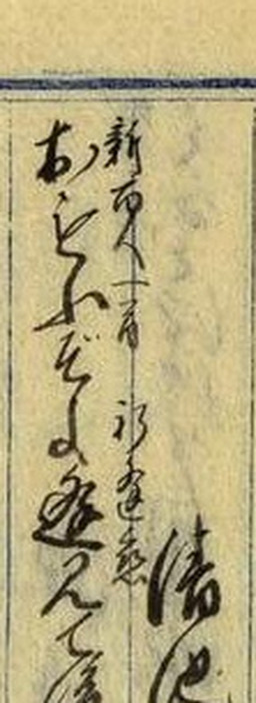新百人一首行逢恋
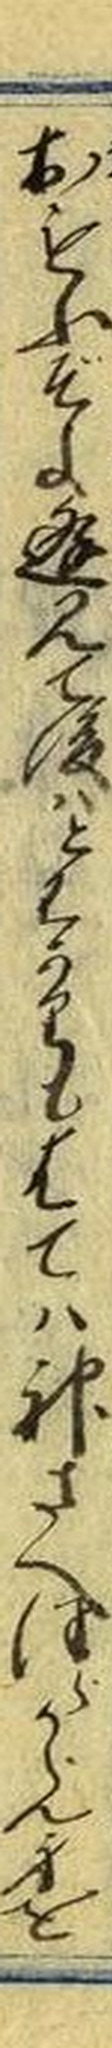おもふぞよ逢見て後はとわかりもはては神さへつらからん身を
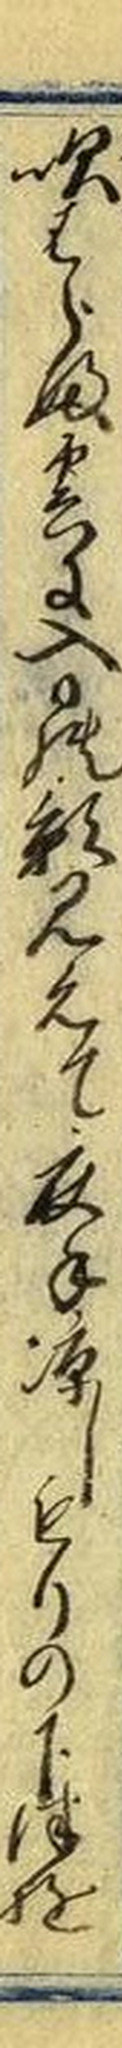吹はらふ雲に入日の影見えて衣手涼しもりの下つゆ
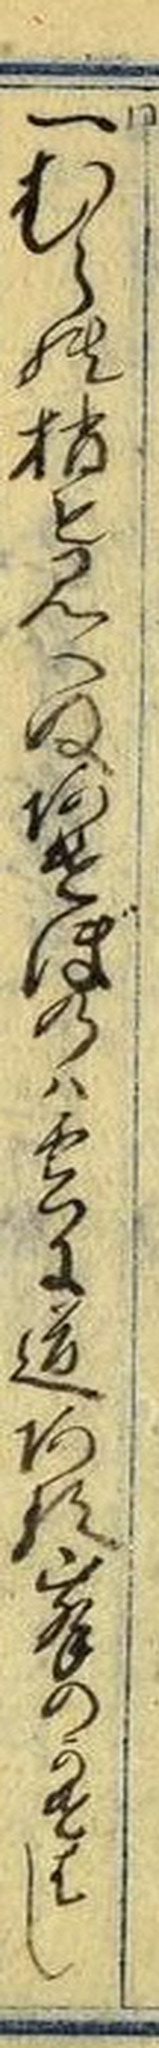一むらの梢も見えぬあけぼのは雲に道ある峯のかけはし

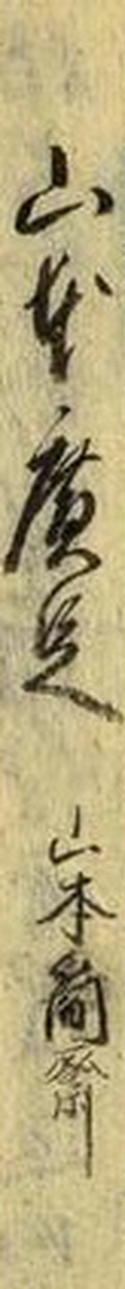山本廣足山本筒齋
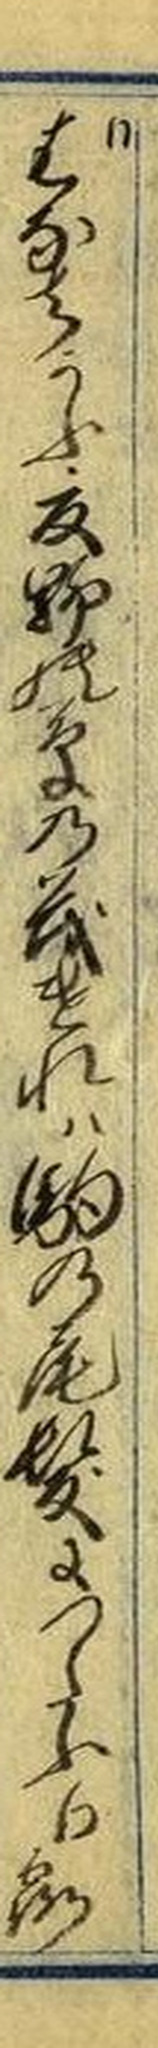はなさかふ夏野の草の茂けれは駒の尾髪につたふ白露
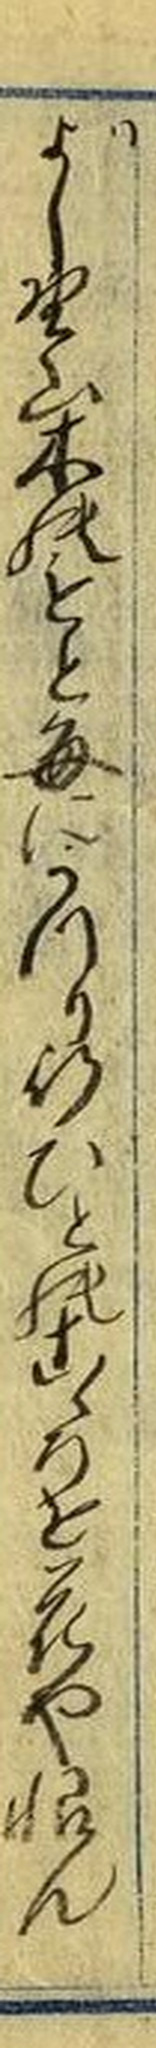よし野山木のもと毎にうつり行ひとのこゝろを花や恨ん
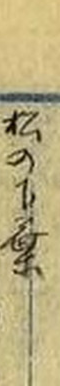松の下葉
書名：温古集 三巻
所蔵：福井県文書館 Fukui Prefectural Archives
